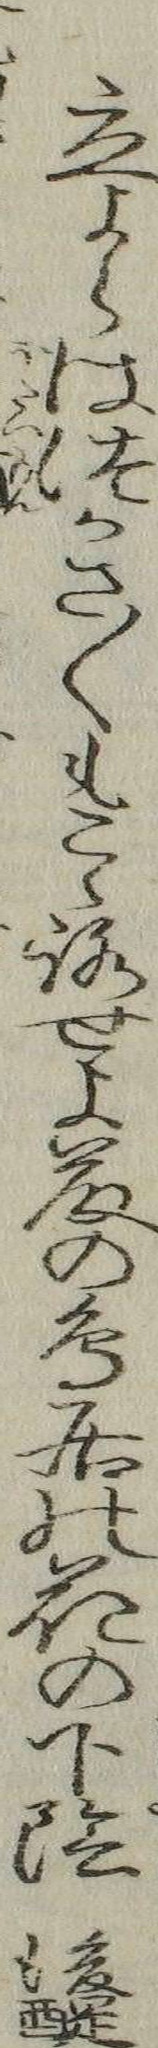立よらはつかさ〳〵もこゝろせよ藤の鳥居の花の下陰後醍醐天皇
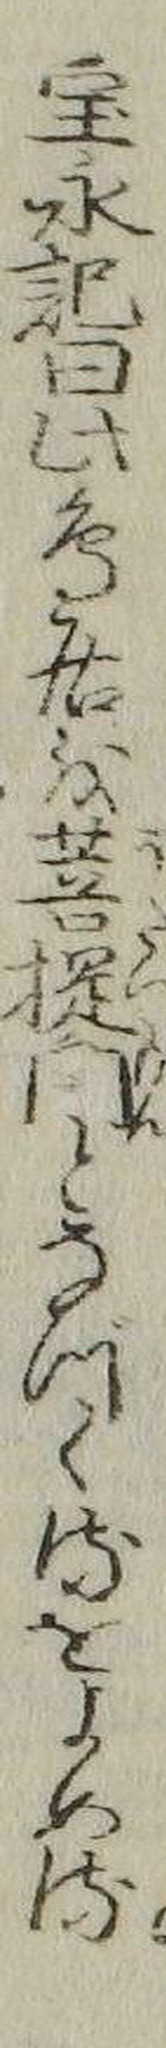宝永記曰此鳥居を菩提門となづくるをよめる
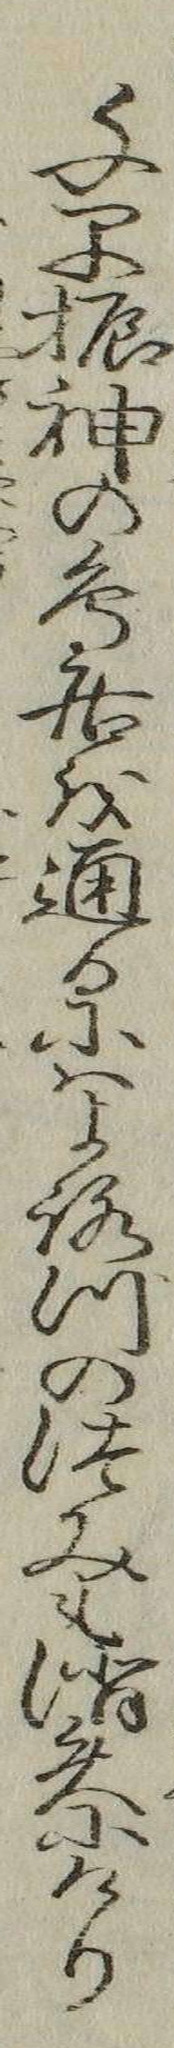千早振神の鳥居を通るにはよろつのつみも消失けり

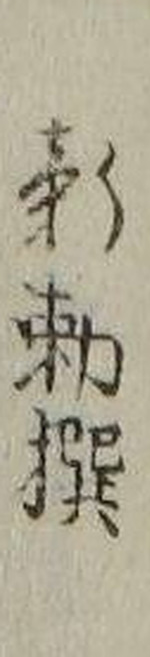新勅撰
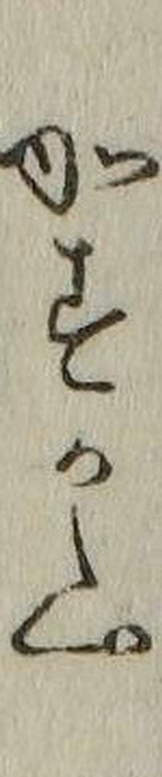かすか山
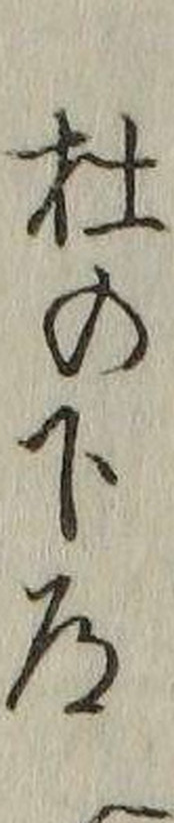杜の下道
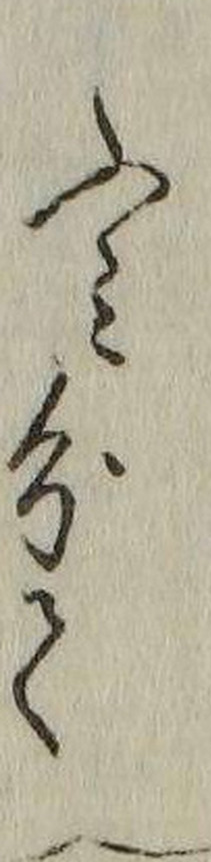ふみ分て
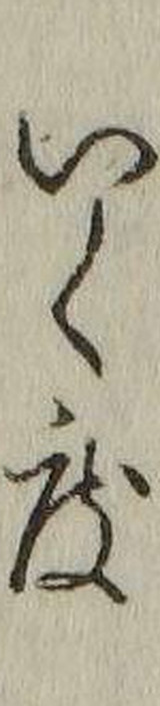いく度
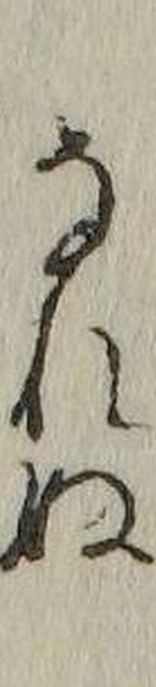なれぬ
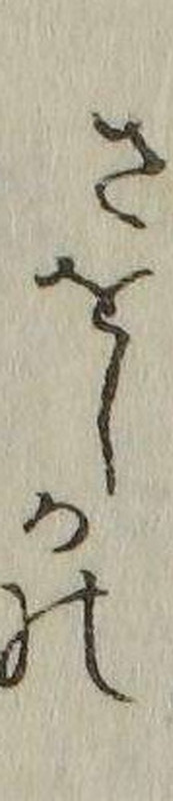さをしかの
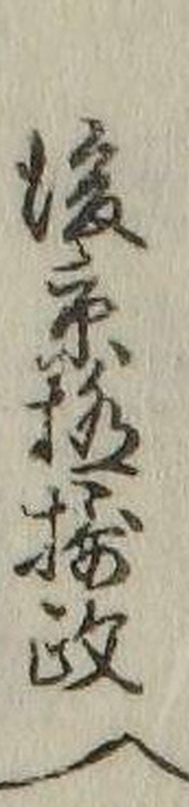誤京極摂政
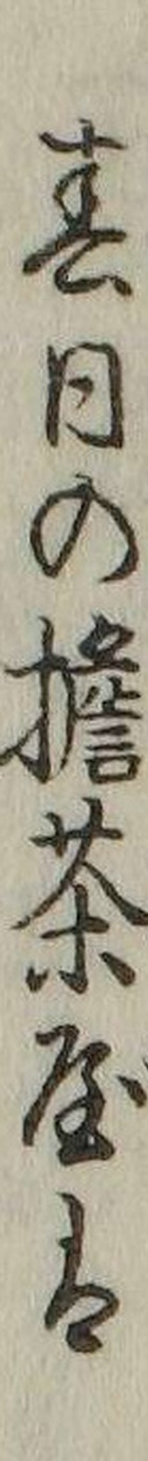春日の擔茶屋は
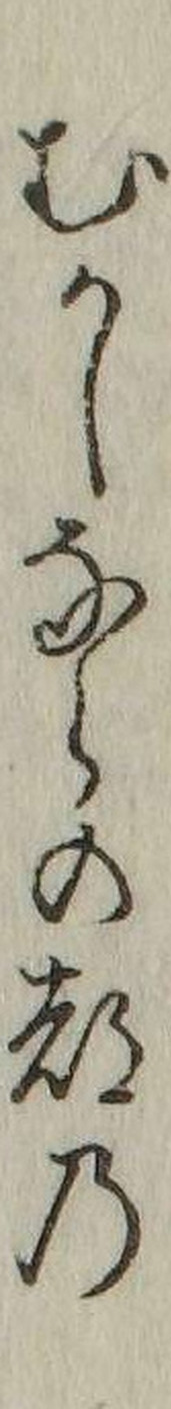むかしならの都の
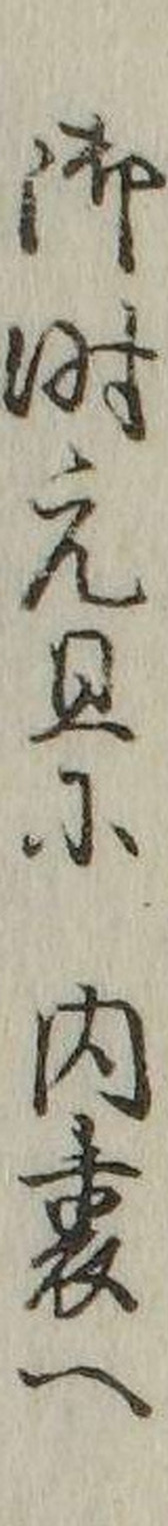御时元旦に内裏へ
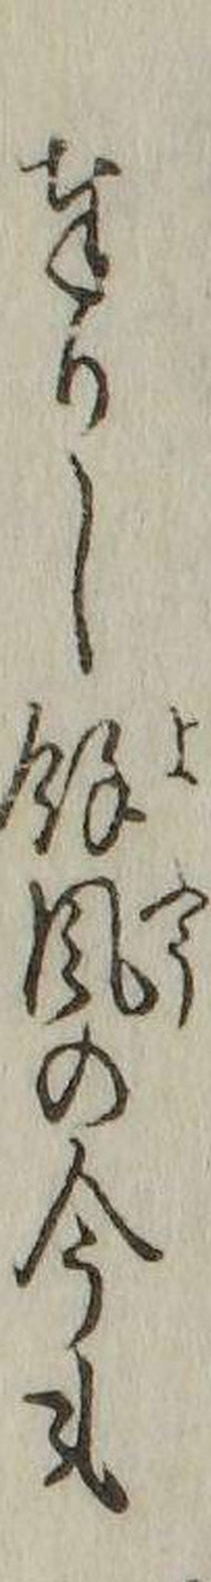奉りし餘風の今も
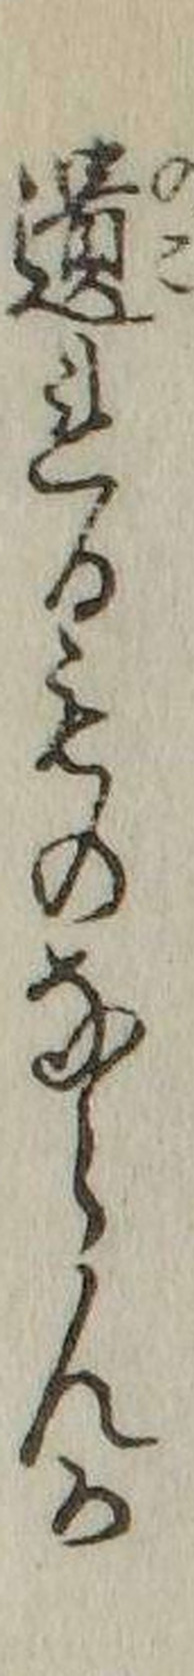遺れるものならんか
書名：大和名所圖會
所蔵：国文学研究資料館
